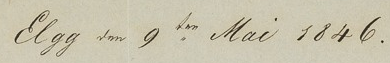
Elgg den 9ten Mai 1846.
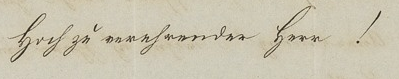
Hochzuverehrender Herr!
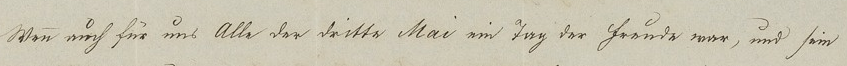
Wenn auch für uns Alle der dritte Mai ein Tag der Freude war, und sein
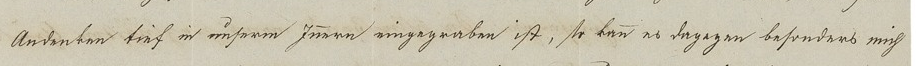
Andenken tief in unserm Innern eingegraben ist, so kann es dagegen besonders mich
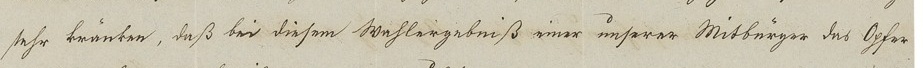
sehr kränken, daß bei diesem Wahlergebniß einer unserer Mitbürger das Opfer
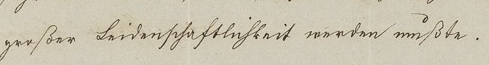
großer Leidenschaftlichkeit werden mußte.
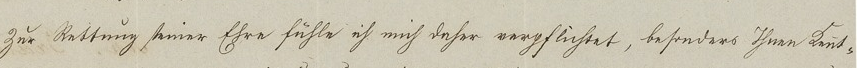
Zur Rettung seiner Ehre fühle ich mich daher verpflichtet, besonders Ihnen Kennt-
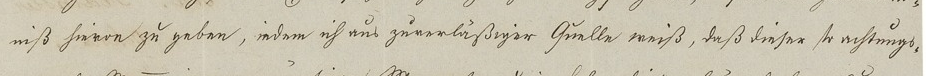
niß hievon zu geben, indem ich aus zuverläßiger Quelle weiß, daß dieser so achtungs-
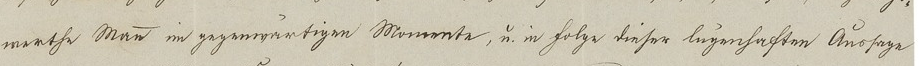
werthe Mann im gegenwärtigen Momente, u. in folge dieser lügenhaften Aussage
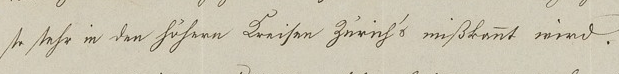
so sehr in den höhern Kreisen Zürich's mißkannt wird.
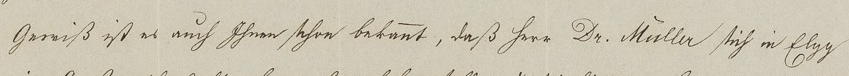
Gewiß ist es auch Ihnen schon bekannt, daß Herr Dr. Müller sich in Elgg
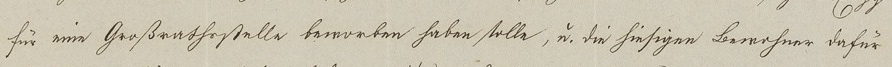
für eine Großrathsstelle beworben haben solle, u. die hiesigen Bewohner dafür
